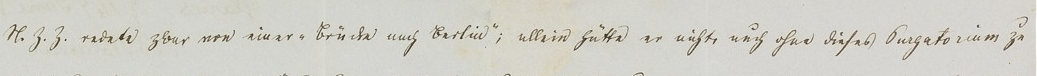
N.Z.Z. redete zwar von einer «Brücke nach Berlin»; allein hätte er nicht, auch ohne dieses Purgatorium zu
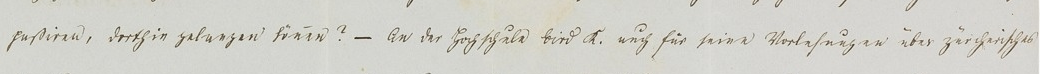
passiren, dorthin gelangen können? – An der Hochschule wird K. auch für seine Vorlesungen über zürcherisches
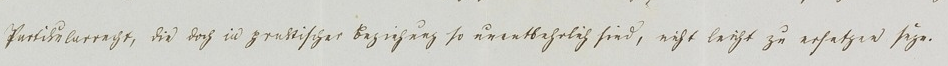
Partikularrecht, die doch in praktischer Beziehung so unentbehrlich sind, nicht leicht zu ersetzen seyn.
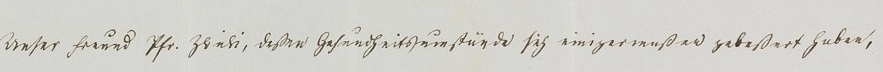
Unser Freund Pfr. Zwicki, dessen Gesundheitsumstände sich einigermaßen gebessert haben,
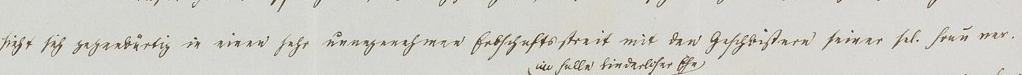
sieht sich gegenwärtig in einen sehr unangenehmen Erbschaftsstreit mit den Geschwisternseiner sel. Frau ver-
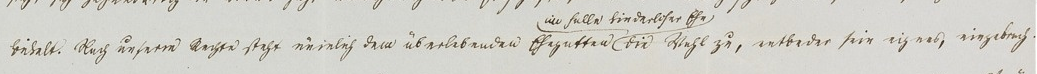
wickelt. Nach unserm Rechte steht nämlich dem überlebenden Ehegatten im Falle kinderloser Ehe die Wahl zu, entweder sein eignes, eingebrach-
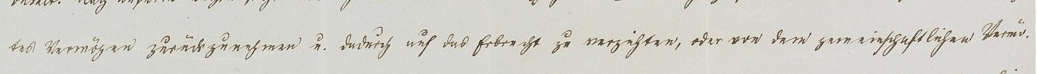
tes Vermögen zurückzunehmen u. dadurch auf das Erbrecht zu verzichten, oder von dem gemeinschaftlichen Vermö-
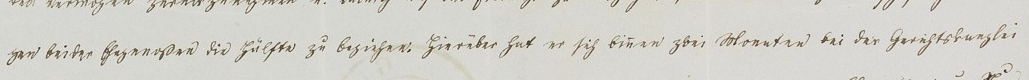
gen beider Ehegenossen die Hälfte zu beziehen. Hierüber hat er sich binnen zwei Monaten bei der Gerichtskanzlei
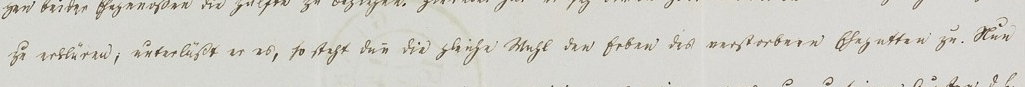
zu erklären; unterläßt er es, so steht dann die gleiche Wahl den Erben des verstorbnen Ehegatten zu. Nun
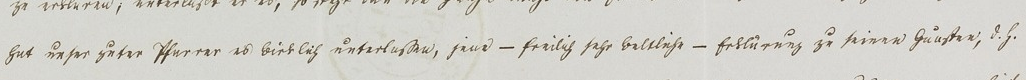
hat unser guter Pfarrer es wirklich unterlassen, jene – freilich sehr weltliche – Erklärung zu seinen Gunsten, d. h.
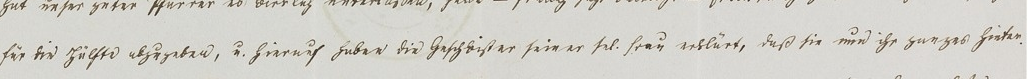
für die Hälfte abzugeben, u. hierauf haben die Geschwisterseiner sel. Frau erklärt, daß sie nun ihr ganzes hinter-
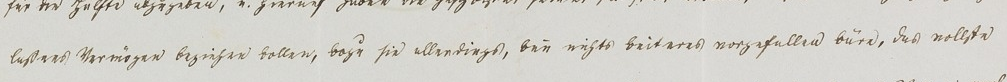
laßnes Vermögen beziehen wollen, wozu sie allerdings, wenn nichts weiteres vorgefallen wäre, das vollste
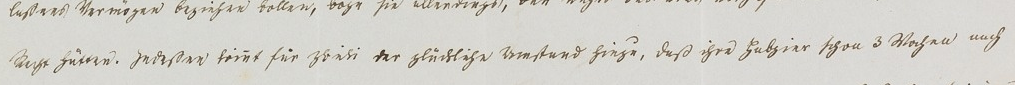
Recht hätten. Indessen kömmt für Zwicki der glückliche Umstand hinzu, daß ihre Habgier schon 3 Wochen nach
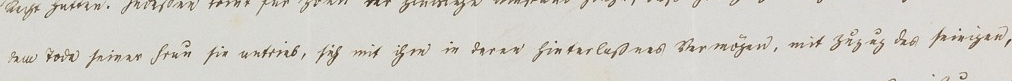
dem Tode seiner Frau sie antrieb, sich mit ihm in deren hinterlaßnes Vermögen, mit Zuzug des seinigen,
